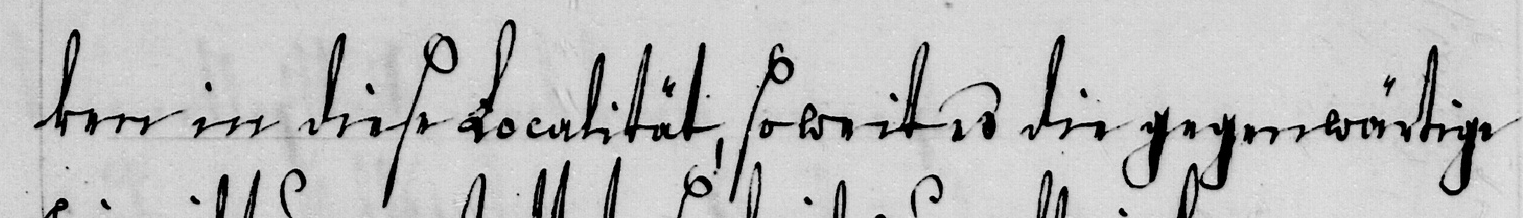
ken in diese Localität, soweit es die gegenwärtige
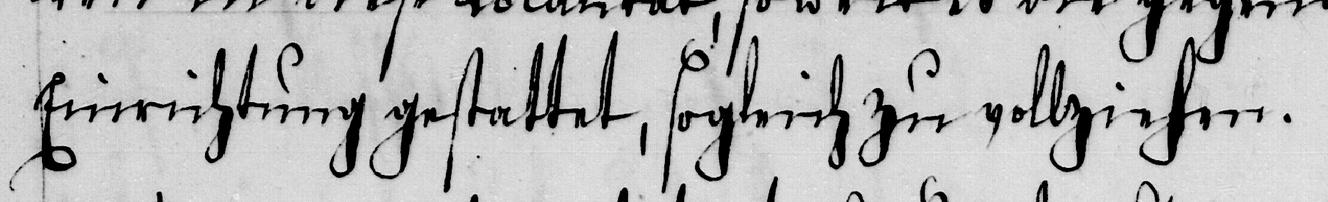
Einrichtung gestattet, sogleich zu vollziehen.
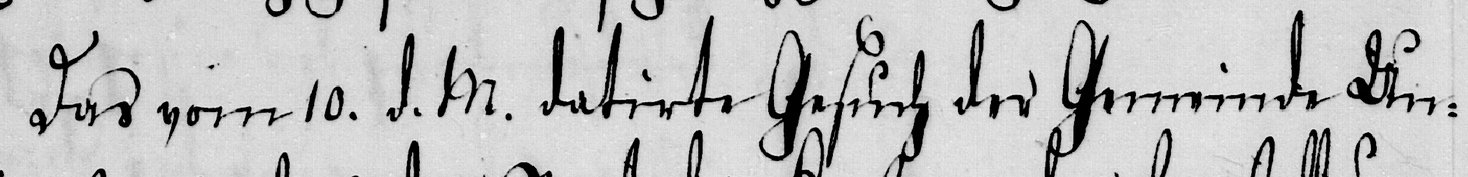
Das vom 10. d. M. datirte Gesuch der Gemeinde Un¬
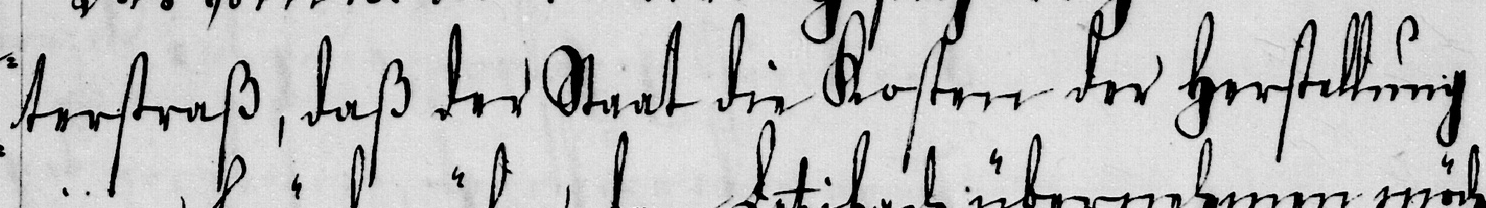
terstraß, daß der Staat die Kosten der Herstellung
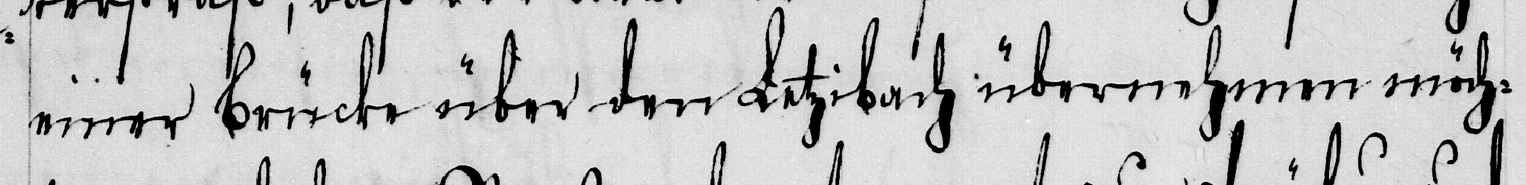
einer Brücke über den Letzibach übernehmen möch¬
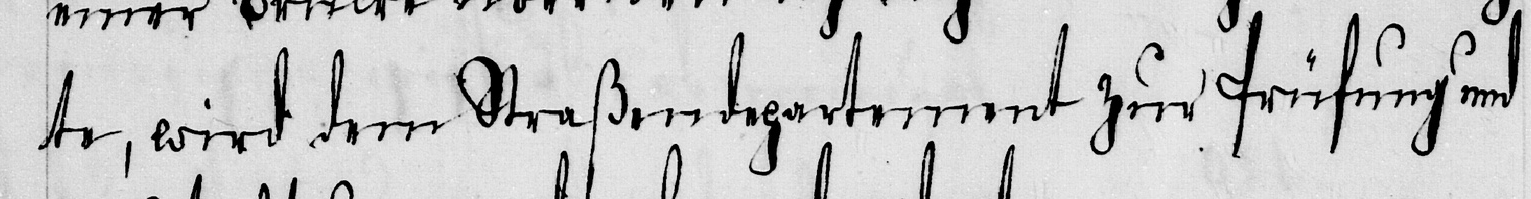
te, wird dem Straßendepartement zur Prüfung und
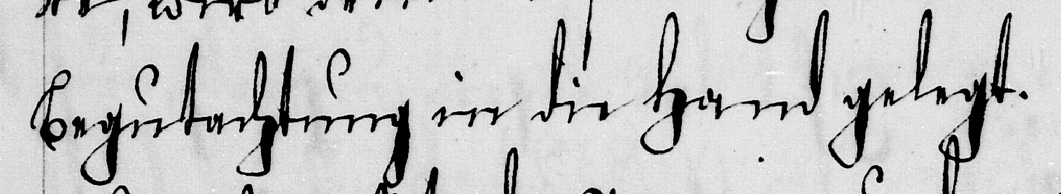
Begutachtung in die Hand gelegt.
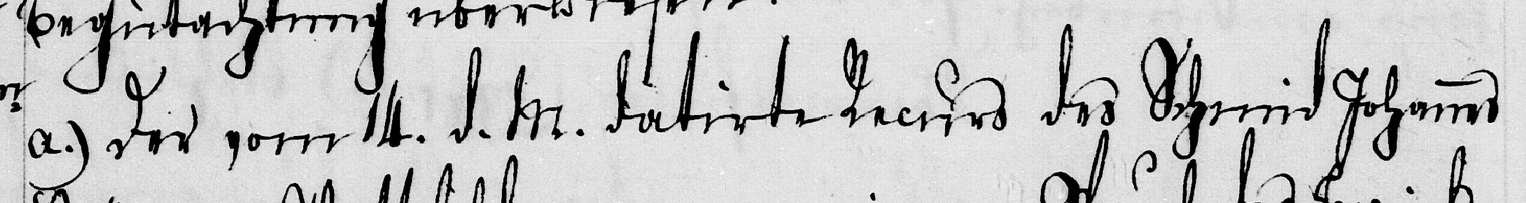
a.) Der vom 14. d. M. datirte Recurs des Schmid Johannes
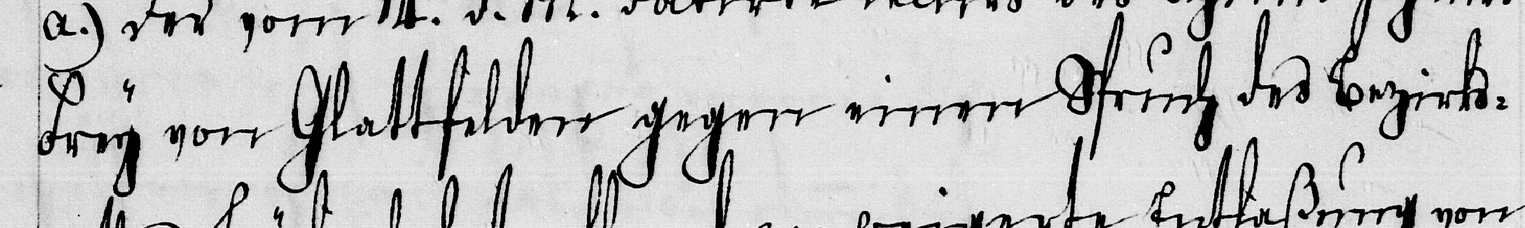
Frey von Glattfelden gegen einen Spruch des Bezirks¬
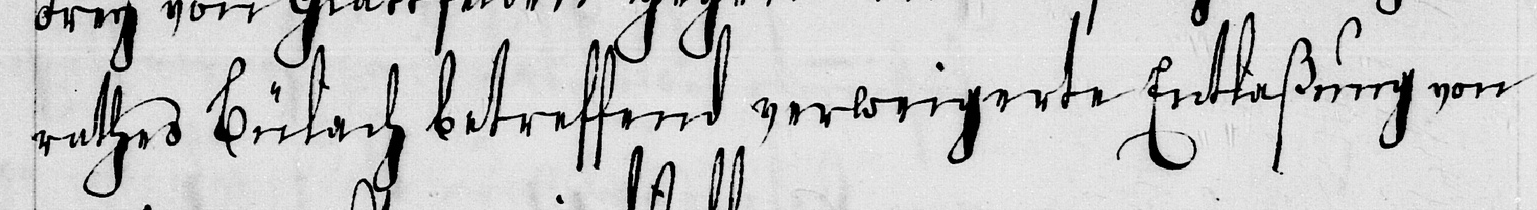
rathes Bülach betreffend verweigerte Entlaßung von
